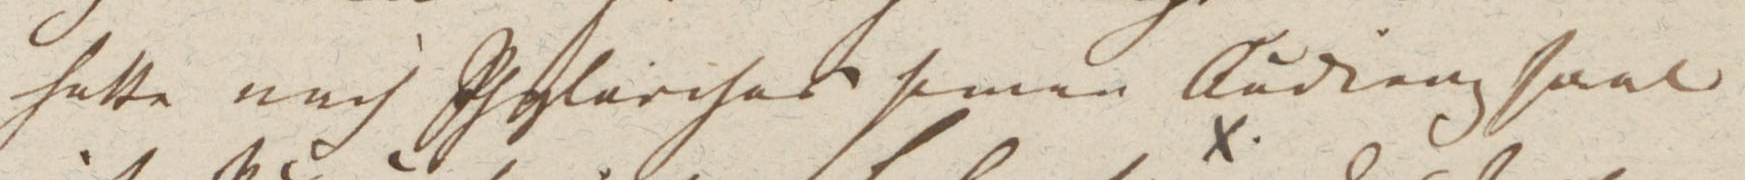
hatte nach Phylarchs seinen Audienzsaal
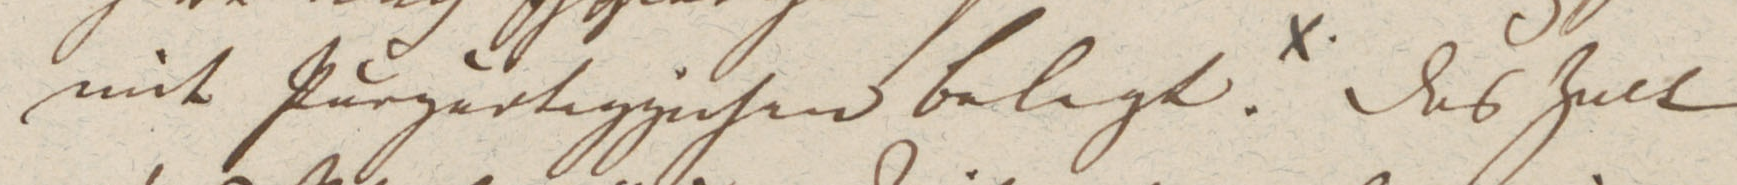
mit Purpurteppichen belegt. % Das Zelt
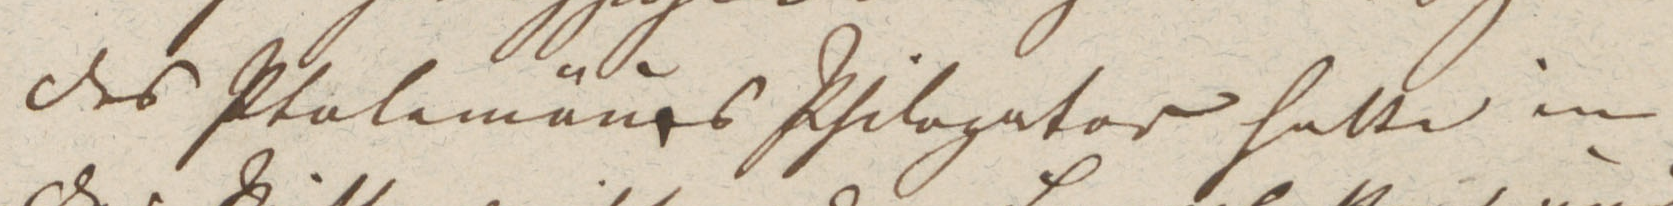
des Ptolemäus Philopator hatte in
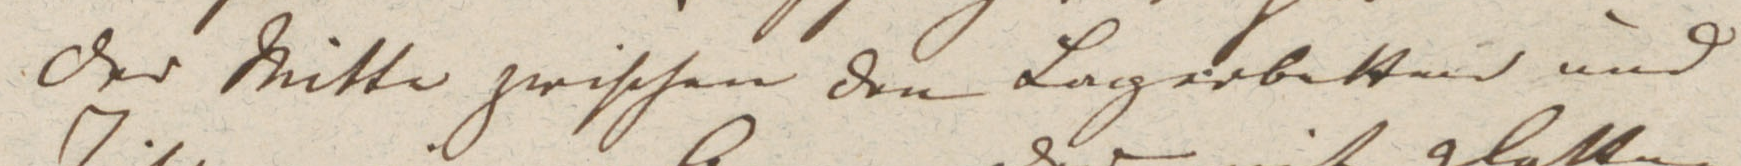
der Mitte zwischen den Lagerbetten und
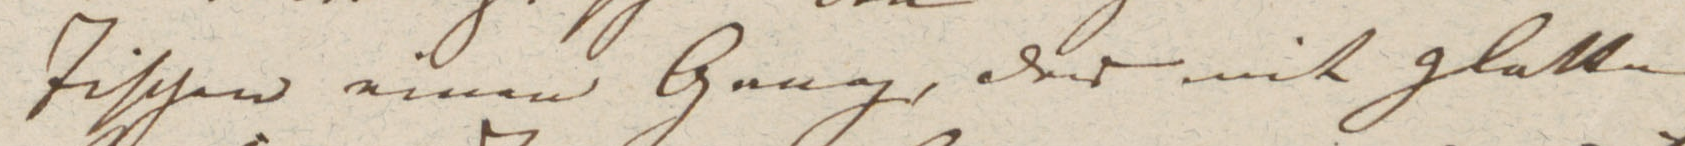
Tischen einen Gang, der mit glatten
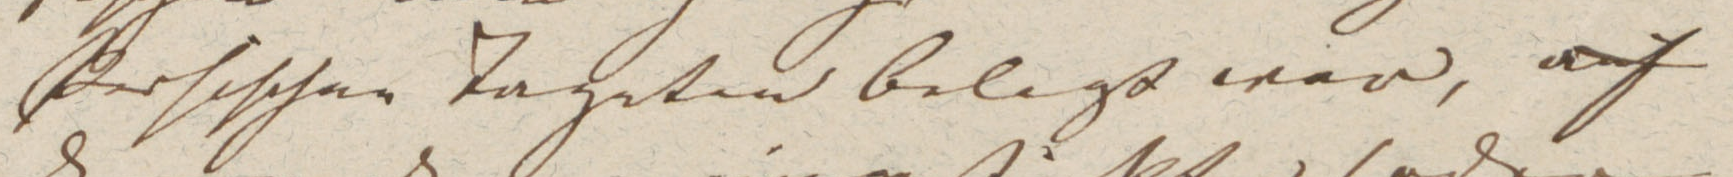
Persischen Tapeten belegt war, auf
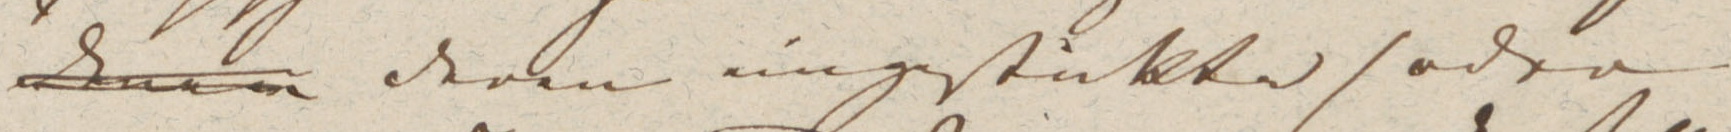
denen deren eingestickte (oder
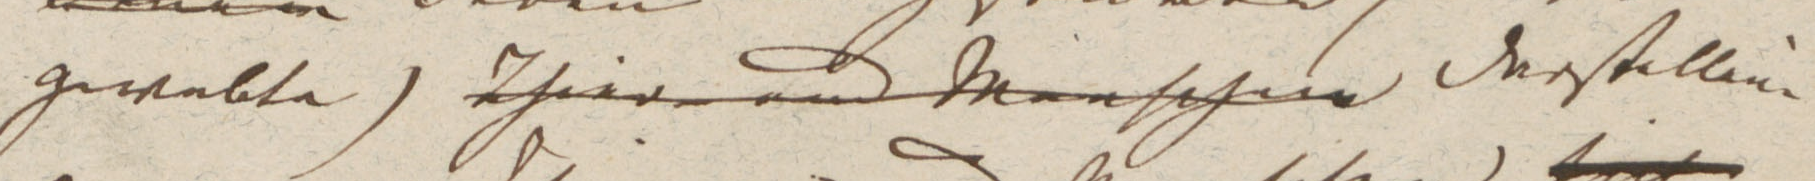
gewebte) Thier- und Menschen Darstellun-
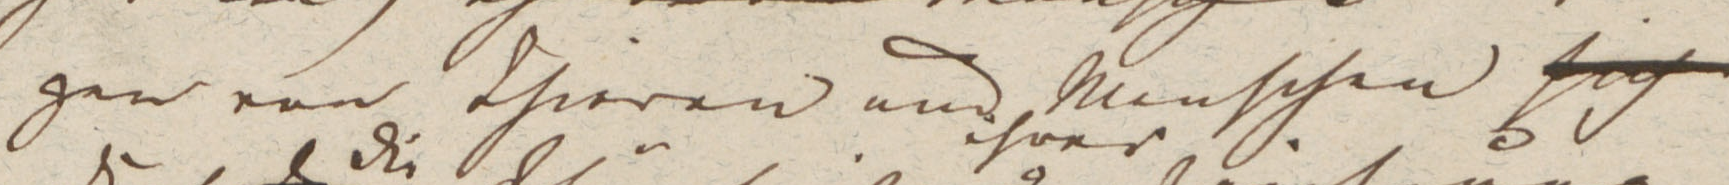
gen von Thieren und Menschen sich
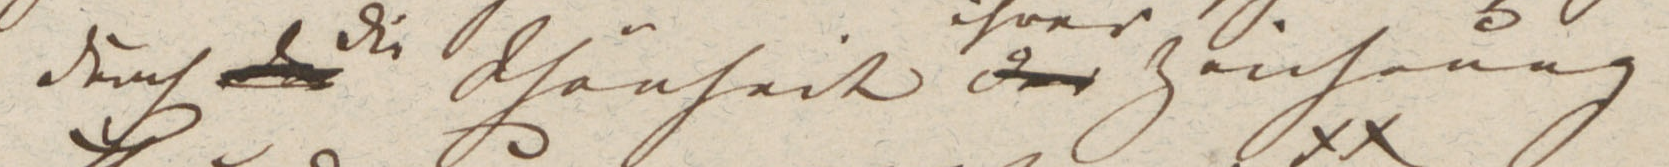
durch da die Schönheit der ihrer Zeichnung
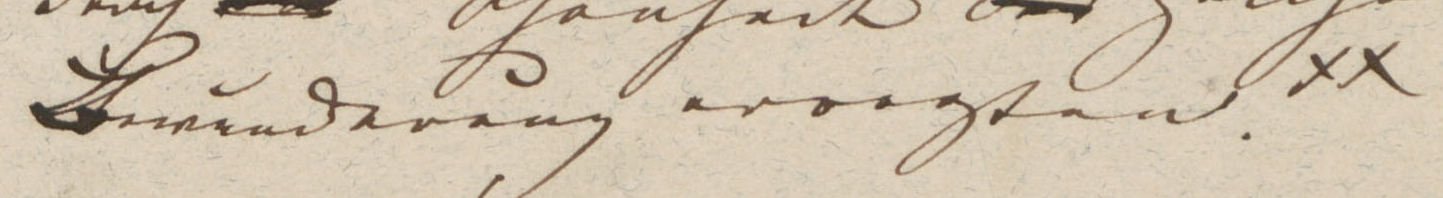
bBewunderung erregten. %
